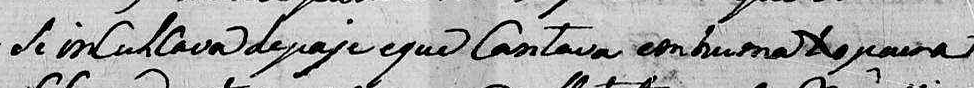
se inCulCava de paje e que Cantava em huma xopana
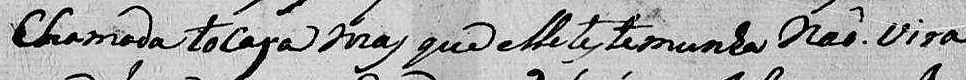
Chamada tocaya mas que elle testemunha naõ. vira
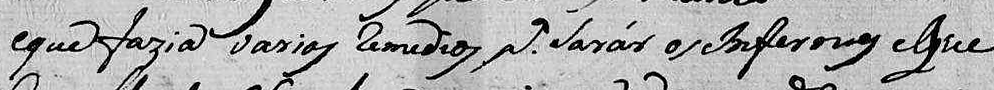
e que fazia varios Remedios p.a sarár os Infermos e Que
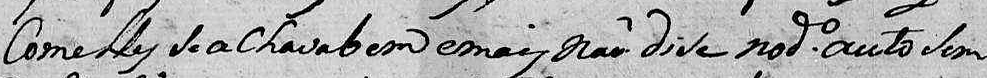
Com elles se aChava bem e mais naõ dise no d.o auto sem
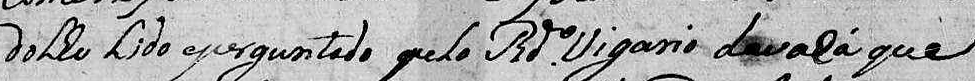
dolhe Lido e perguntado pelo Rd.o Vigario da vará que
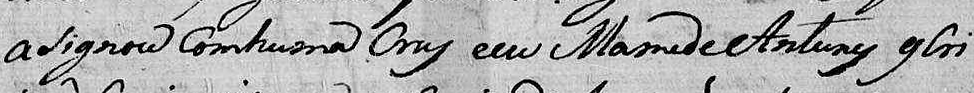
asignou Com huma Crus e eu Mamede Antunes esCri
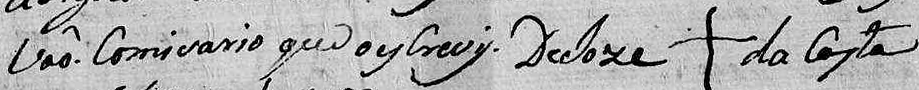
vaõ. Comisario que o esCrevy. De Ioze + da Costa
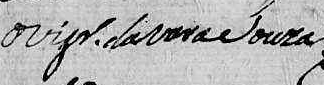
o vigr.o da vara souza
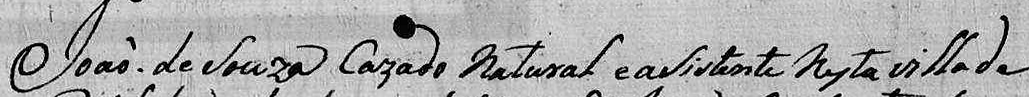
Joaõ. de Souza Cazado natural e aSistente nesta villa de
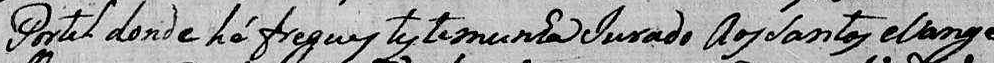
Portel donde hé fregues testemunha Iurado aos Santos eVange
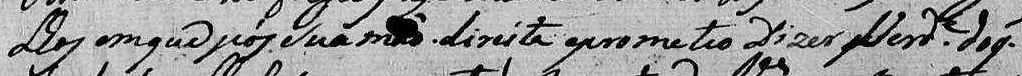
lhos em que pos sua mão direita e prometeo Dizer Verd.e do q̄
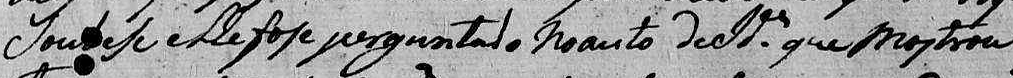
soubese, e lhe fose perguntado no auto de Id.e que mostrou
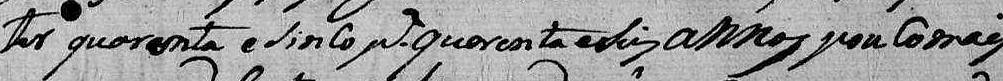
ter quarenta e sinCo p.a quarenta e Seis annos pouCo mais
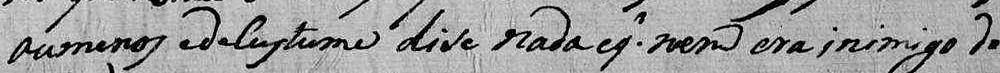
ou menos e de Custume dise nada e q̄. nem era inimigo do
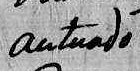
autuado.
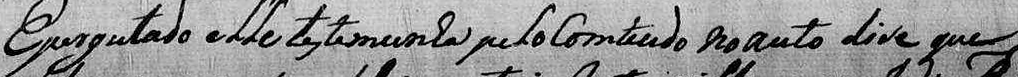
E pergutado elle testemunha pelo Comteudo no auto dise que
